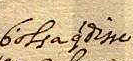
bolsa q̄ disse
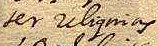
ter reliquias
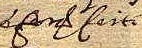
e foraõ feiti
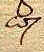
ços
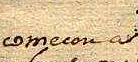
começou a
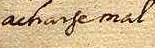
acharse mal
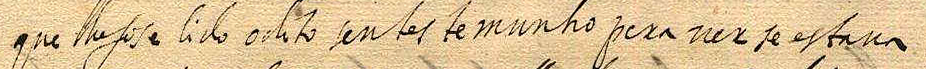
que lhe fose lido o dito seu testemunho pera uer se estaua
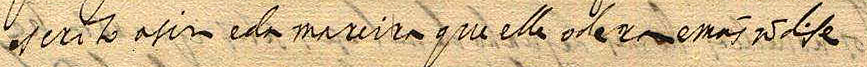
escrito asim e da mareira que elle o dera e mas nō dise
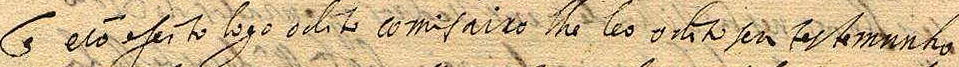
item e cō efeito logo o dito comisairo lhe leo o dito seu testemunho
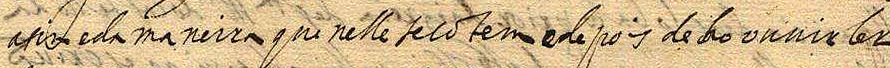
asim e da maneira que nelle se cōtem e depois de ho ouuir ler
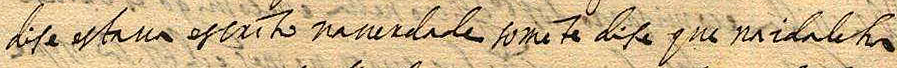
dise estaua escrito na uerdade somēte dise que na idade ha
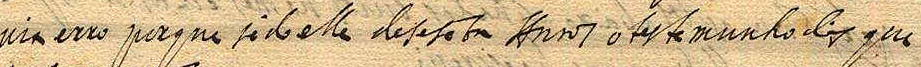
uia erro porque sēdo elle de sesēta Annos o testemunho dis que
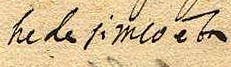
he de simcoēta
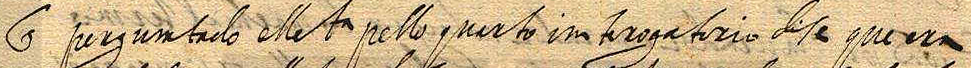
item perguntado elle ta pello quarto imterogatorio dise que era
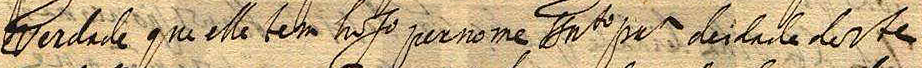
verdade que elle tem hū fo per nome Anto pra de idade de v.te
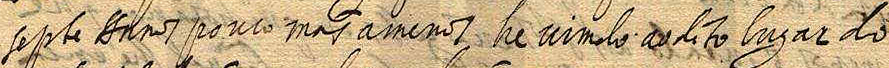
septe Annos pouco mais a menos he uimdo ao dito lugar do
